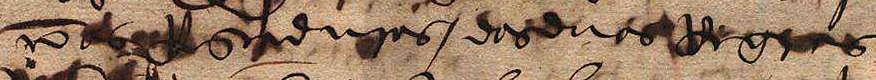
c̄o as Riscaduras / das duas Regras
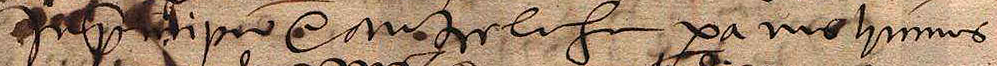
Jn p̄ncipio e antrelinha ꝑa nos hirmos
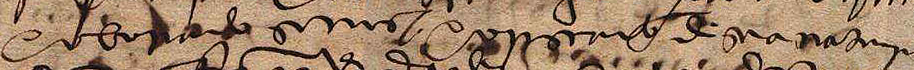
e o borrado se nos / e o riscado de sua natura
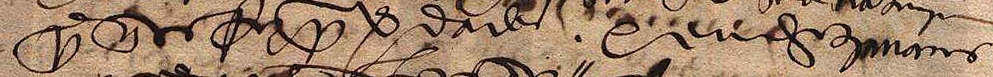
p̄oq̄ se fez p̄o ꝟdade. e eu djo trauacos
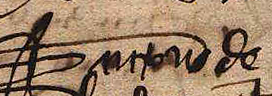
Antonio de
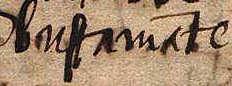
bustamāte
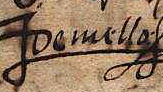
J de mello
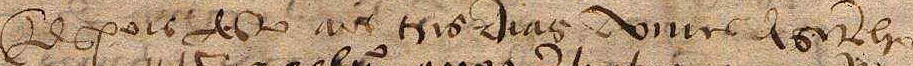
E despois desto aos tres dias do mes de setēbro
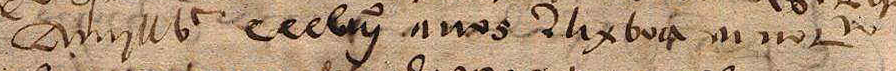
de mjll vc xxxbiijo anos ē lixboa eu notro
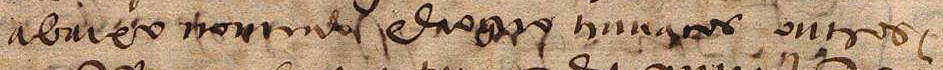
abaixo nomeado e dioguo trauacos outrosy
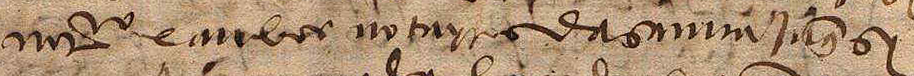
notro e anbos notayros da samta Jnq̄sy
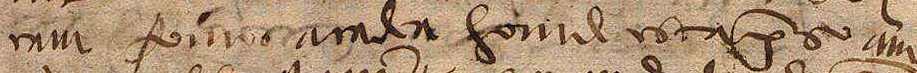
çam fomos a cadea homde esta p̄so am
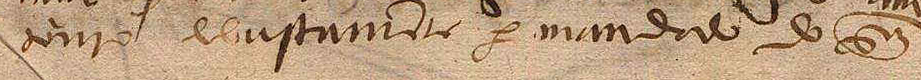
tonjo de bustamēte ꝑ mandado do s̄or
